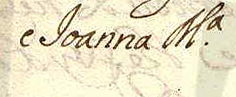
e Ioanna M.a
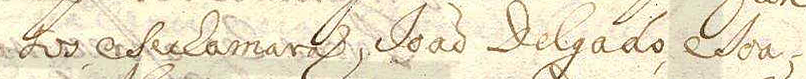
tos, e Se chamaraõ, Ioaõ Delgado, e Ioa
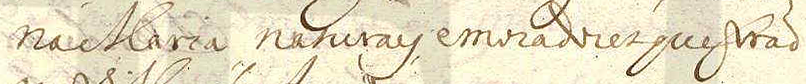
na Maria, naturaes, e moradorez que foraõ
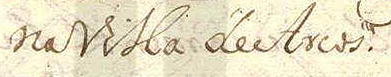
na Villa de Arcos.
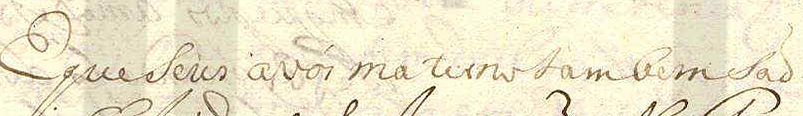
E que Seus avós materno tambem saõ
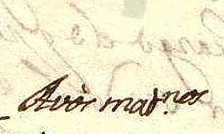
Avòs mat.nos
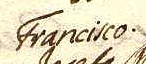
Francisco.
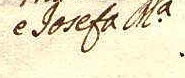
e Iosefa M.a
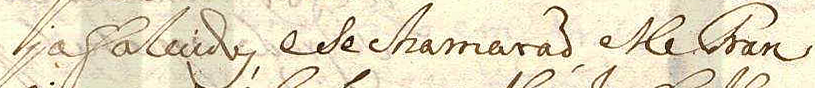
ja falecidos, e se chamaraõ elle Fran
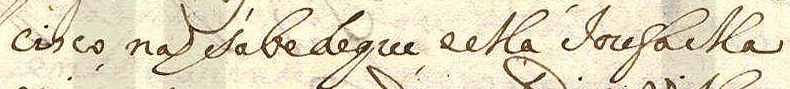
cisco, naõ sabe de que, e ella Iozefa Ma
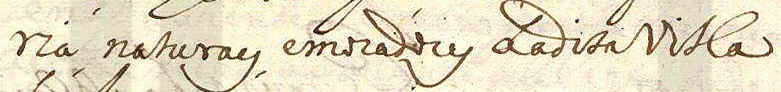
ria, naturaes, e moradores da dita Villa
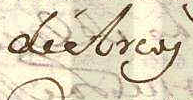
de Arcos
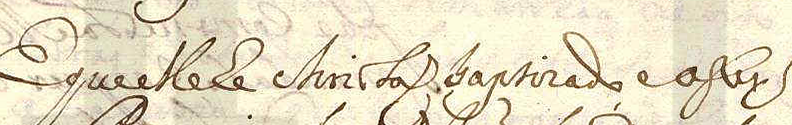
E que elle he christaõ baptizado, e o foy
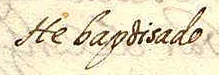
He baptisado
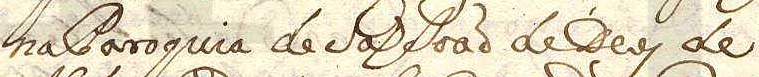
na Paroquia de Saõ Ioaõ de Deos de
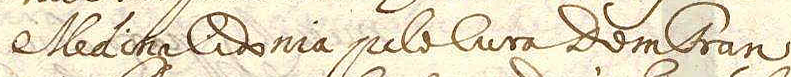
Medina Cidonia pelo Cura Dom Fran
